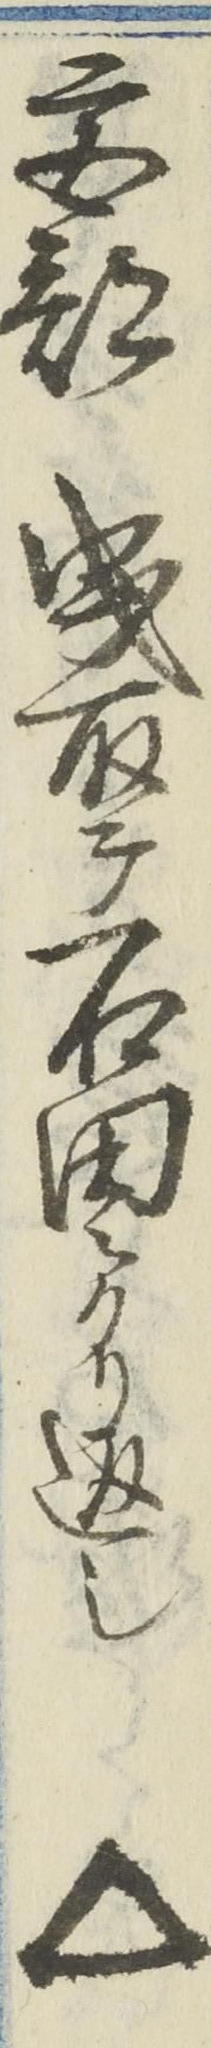宮部曳取テ石田ニクリ返シ
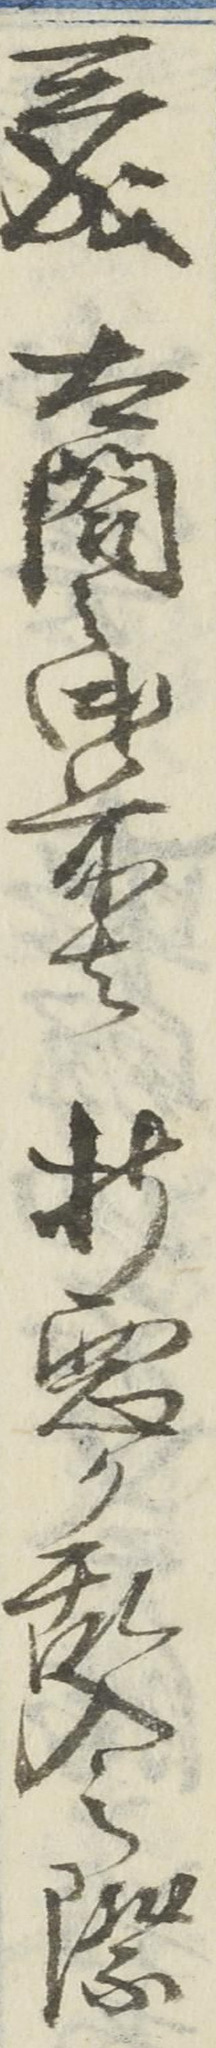三成太閤之御前者折悪ク乱入之際
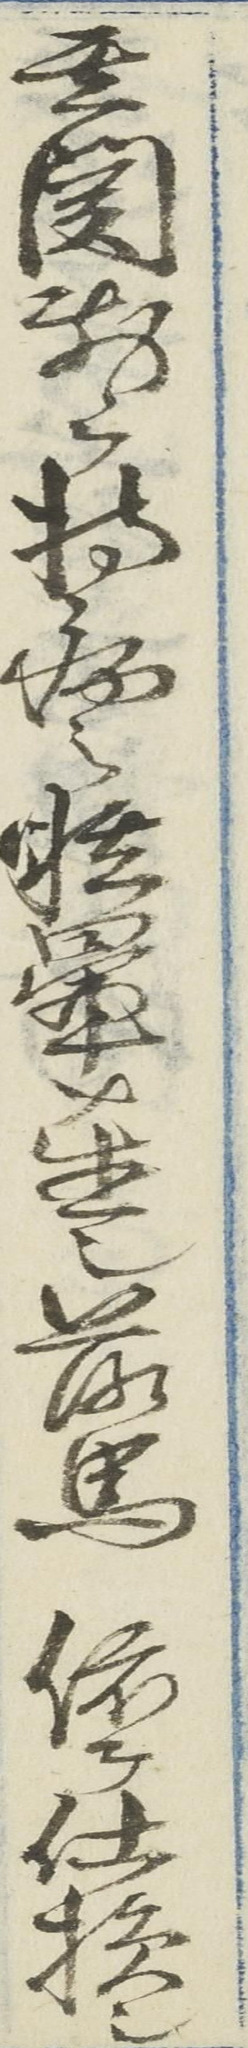玄関前テ持病之眩暈ヲ生シ落馬依テ仕損シ
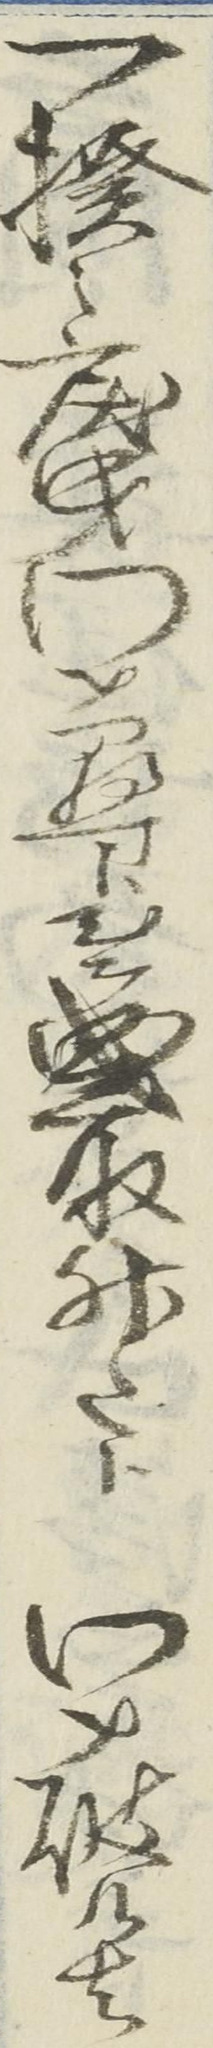一揆之戻閉門ヲ尋ト云テ曳取升たト門ヲ破ル者
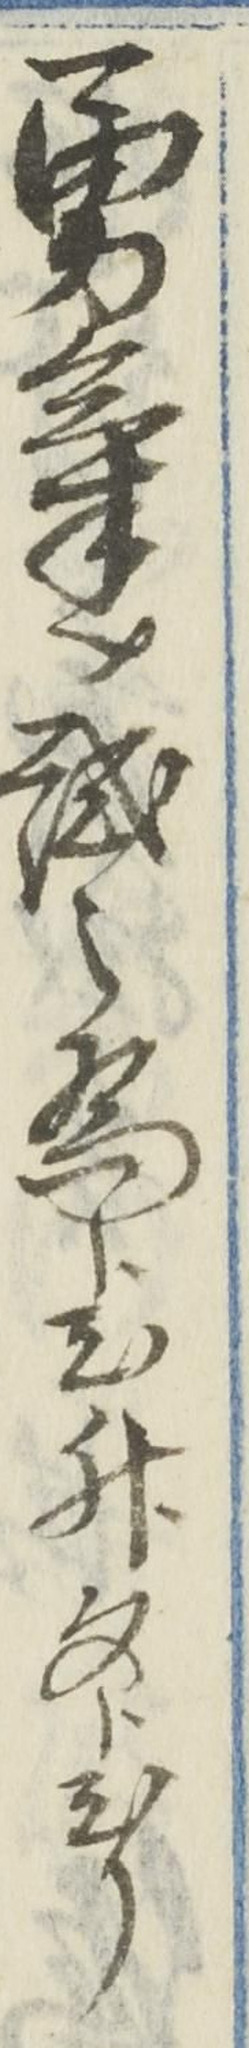勇気ヲ試之為ト云升タト云ウ
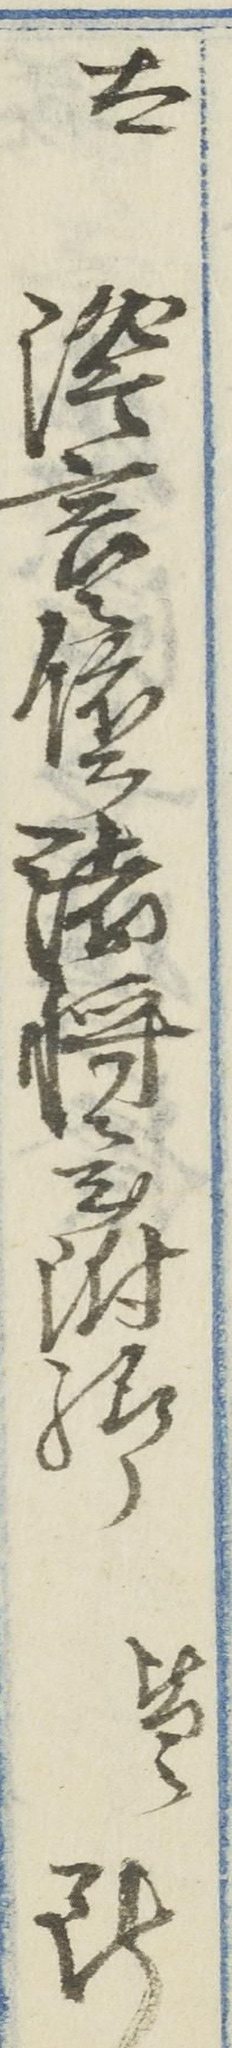太讒言ニ依テ諸将ニ云附給ウ皆々断
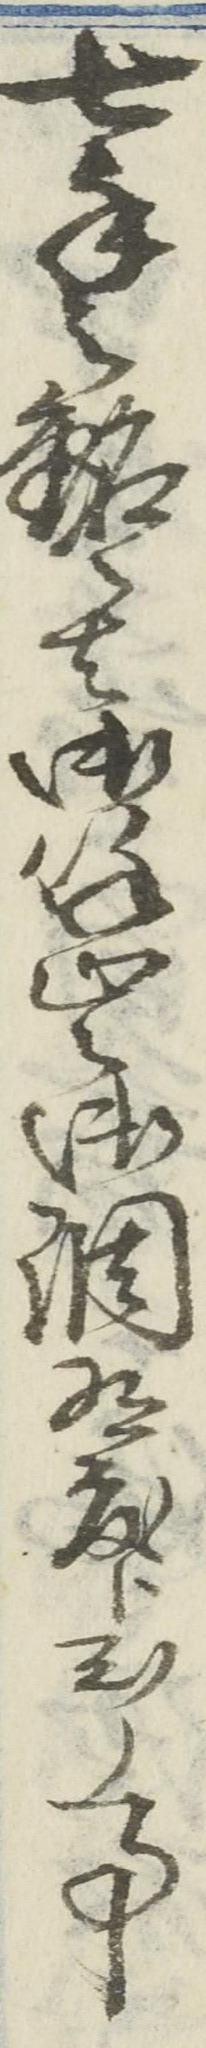七手之銘々者御呼出御調有度ト云ウ事
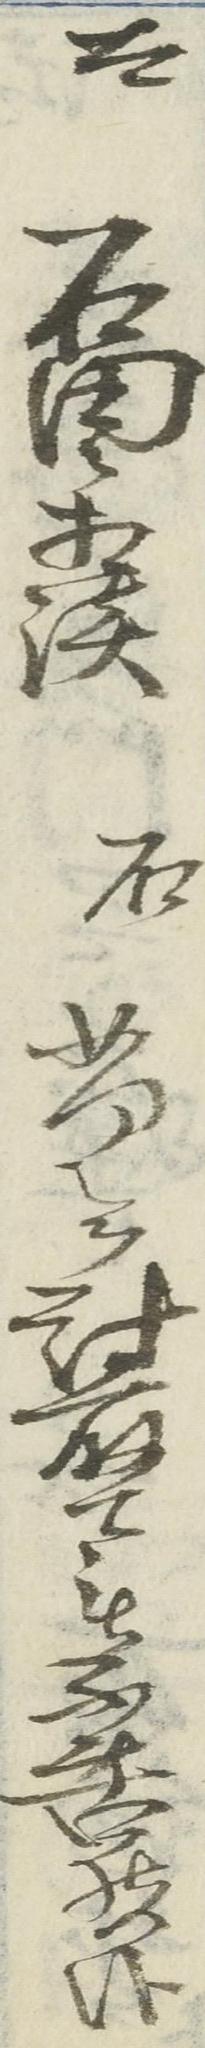太石田ニ相談石如何シテ討取テモ不苦候哉
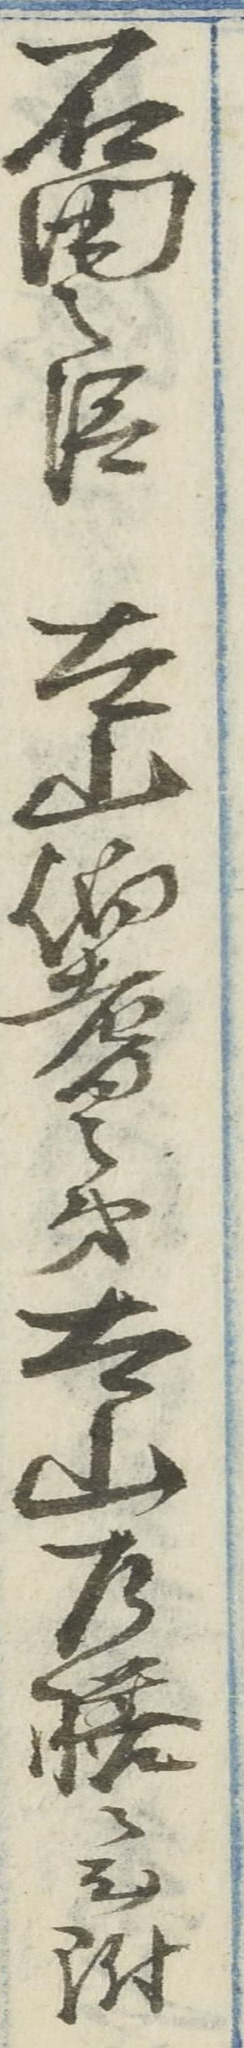石田之臣太山伯耆之弟太山左膳ニ云附
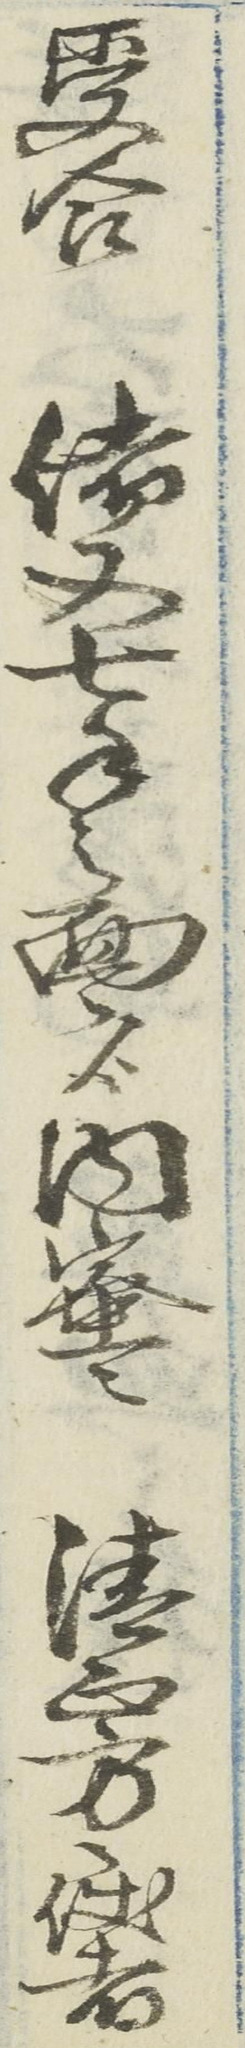受合偖又七手之面々ゟ内蜜ニ清正方ニ使者
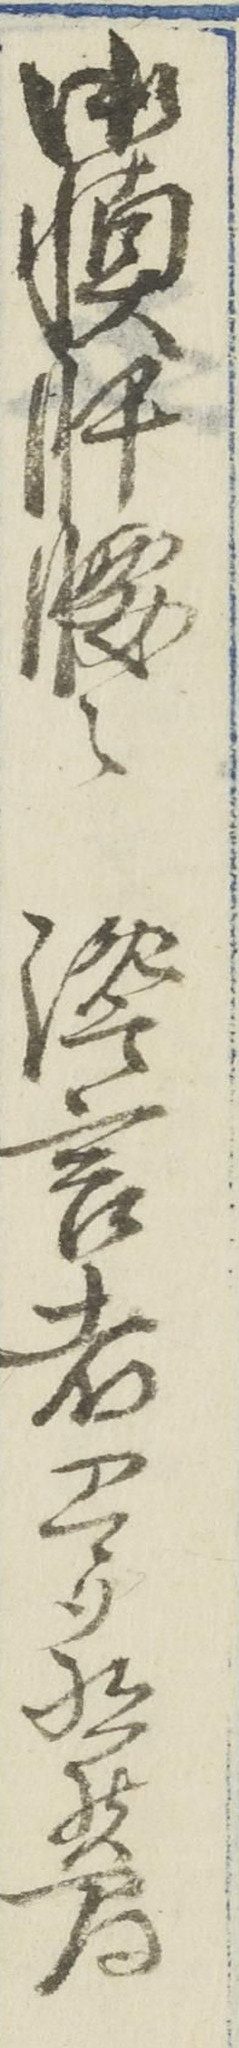御慎肝腰也讒言者アマタ有候間
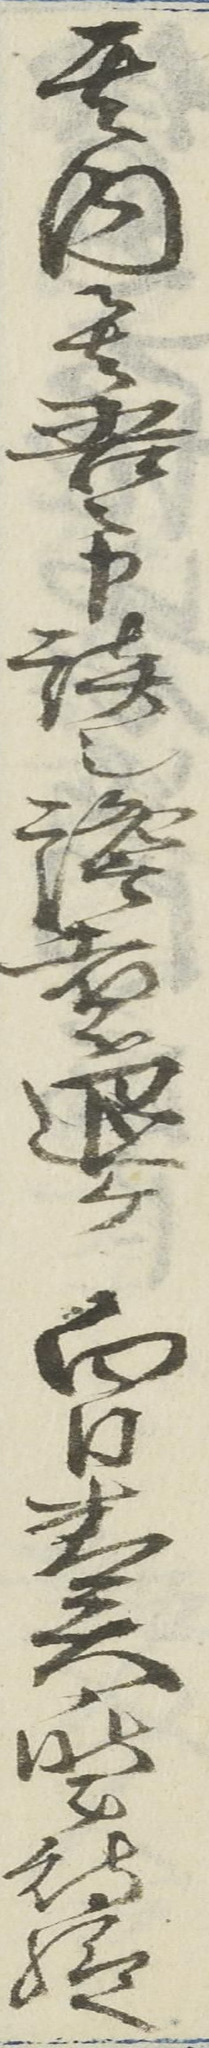其内ニ者吾ニ申談シ讒者ヲ退ケ白日青天ノ時ヲ待従
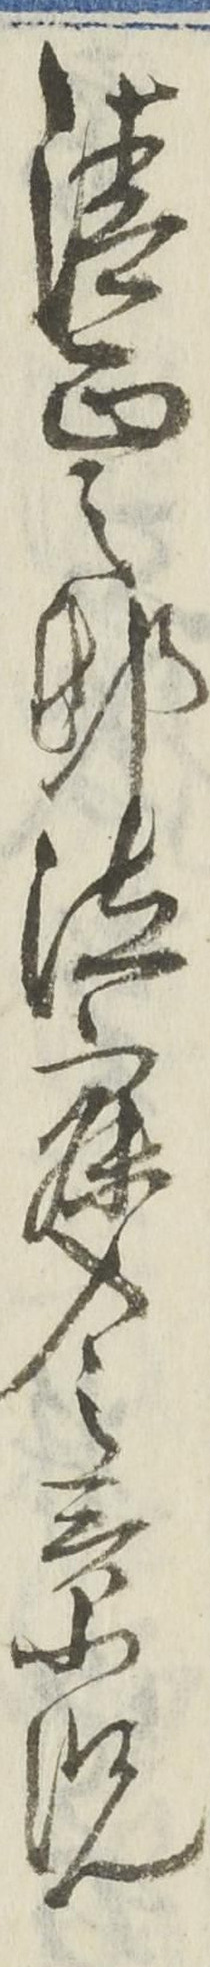清正之邸泣寝入之景況
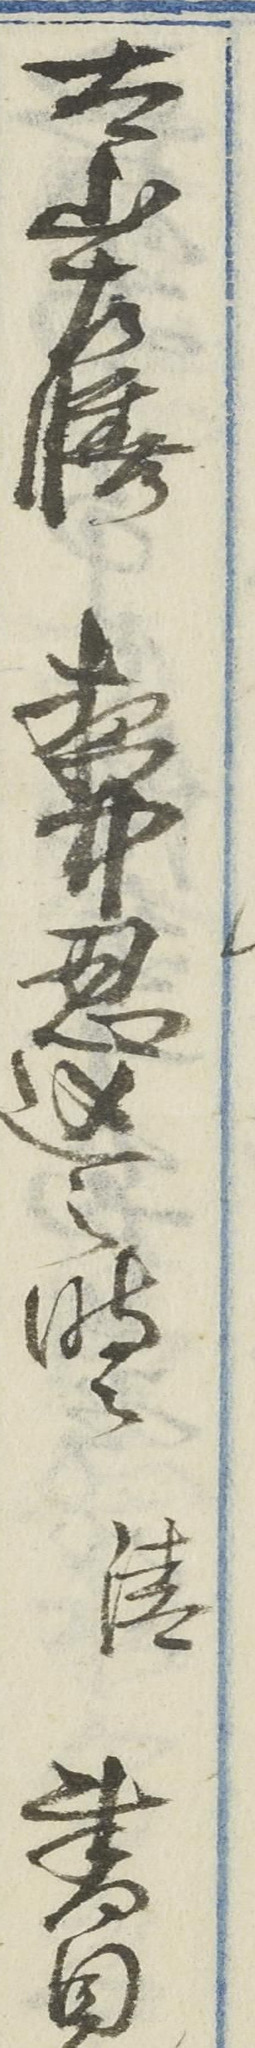太山左膳夜中忍込シ時ニ清書見
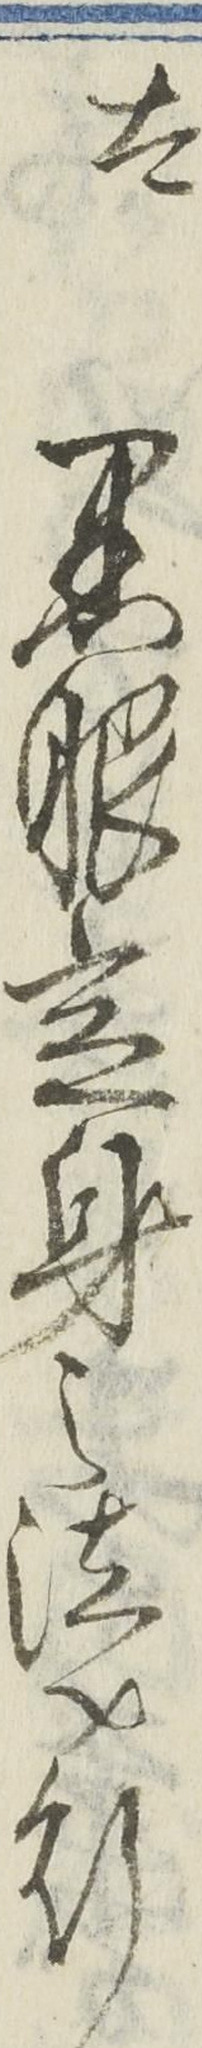太黒眼定身之法ヲ行
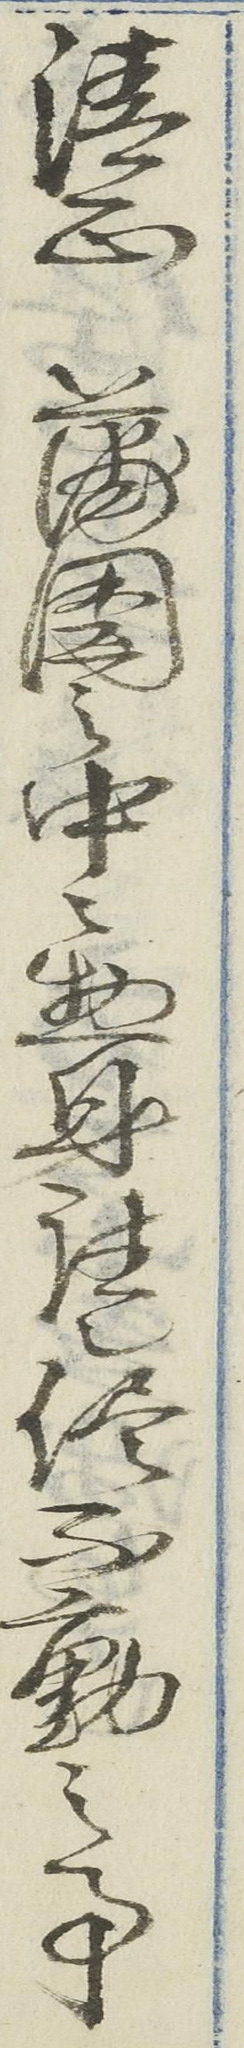清正蒲団之中ニ惣身座シ侭不動之事
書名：伏水大地震
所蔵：東京大学地震研究所図書室 Earthquake Research Institute Library, The University of Tokyo, JAPAN
